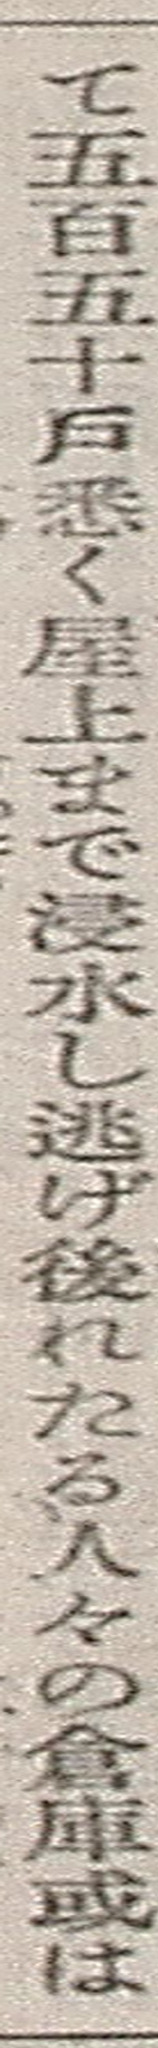て五百五十戸悉く屋上まで浸水し逃げ後れたる人々の倉庫或は
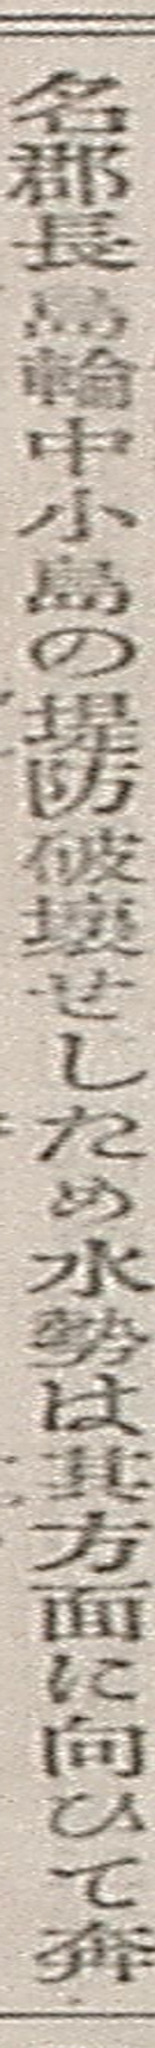名郡長島輪中小島の堤防破壊せしため水勢は其方面に向ひて奔
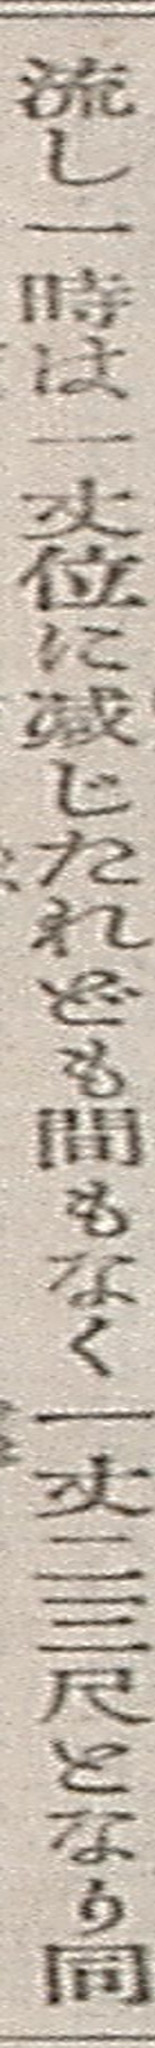流し一時は一丈位に減じたれども間もなく一丈二三尺となり同
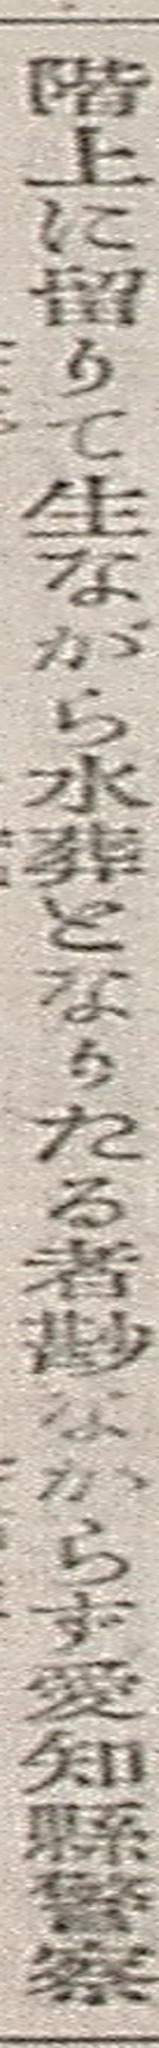階上に留りて生ながら水葬となりたる者尠なからず愛知県警察
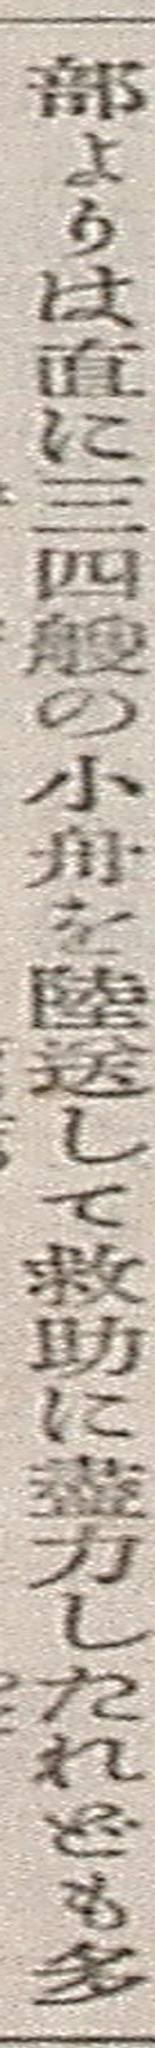部よりは直に三四艘の小舟を陸送して救助に尽力したれども多
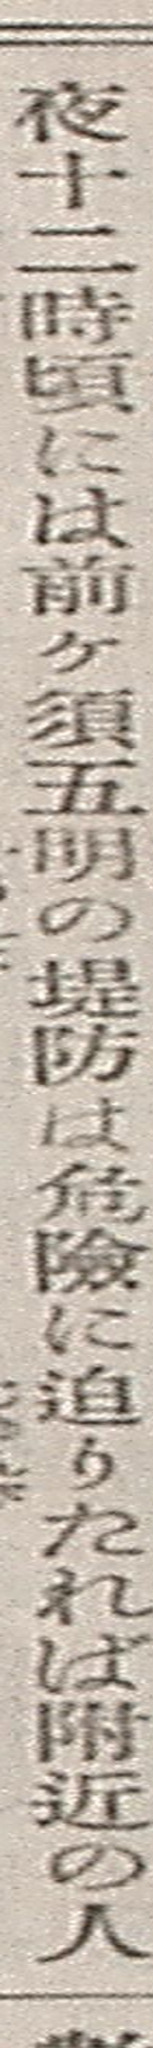夜十二時頃には前ヶ須五明の堤防は危険に迫りたれば附近の人
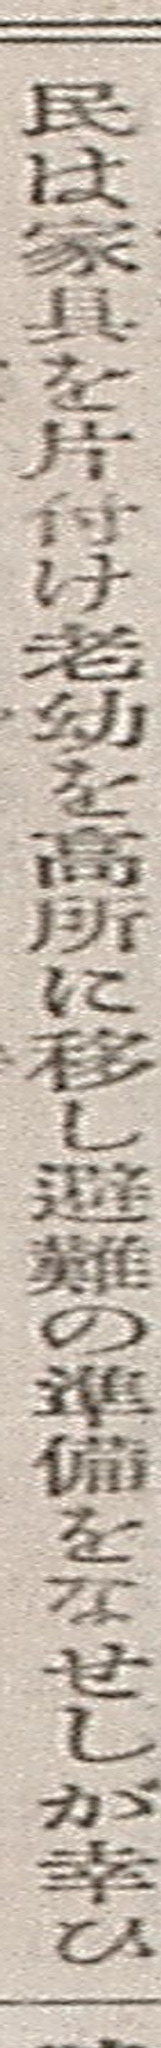民は家具を片付け老幼を高所に移し避難の準備をなせしが幸ひ
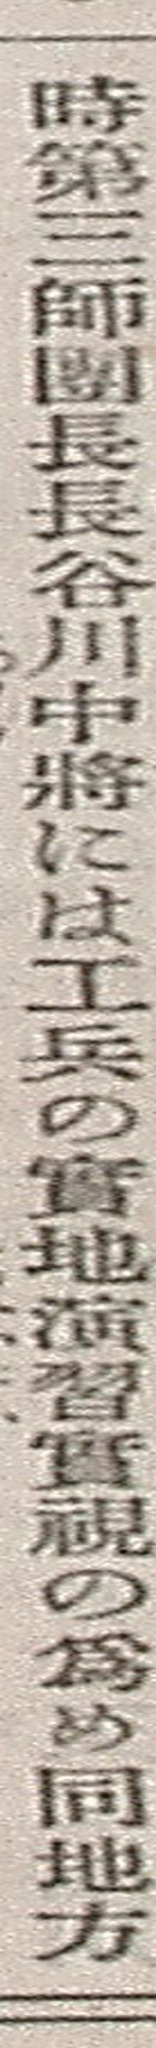時第三師団長長谷川中将には工兵の実地演習実視の為め同地方
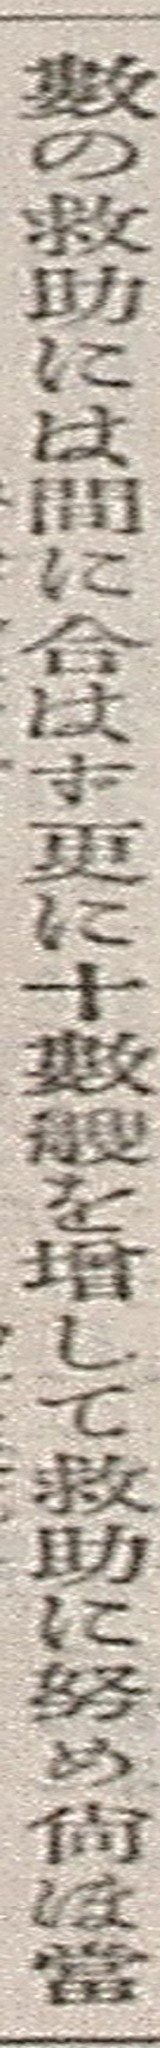数の救助には間に合はず更に十数艘を増して救助に務め尚ほ当
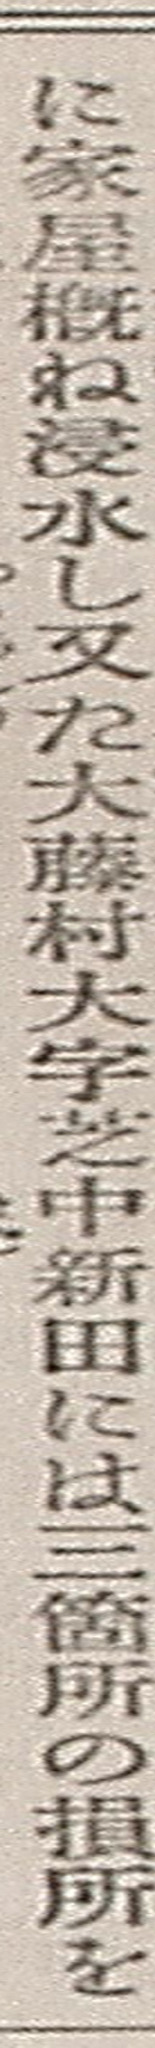に家屋概ね浸水し又た大藤村大字芝中新田には三箇所の損所を
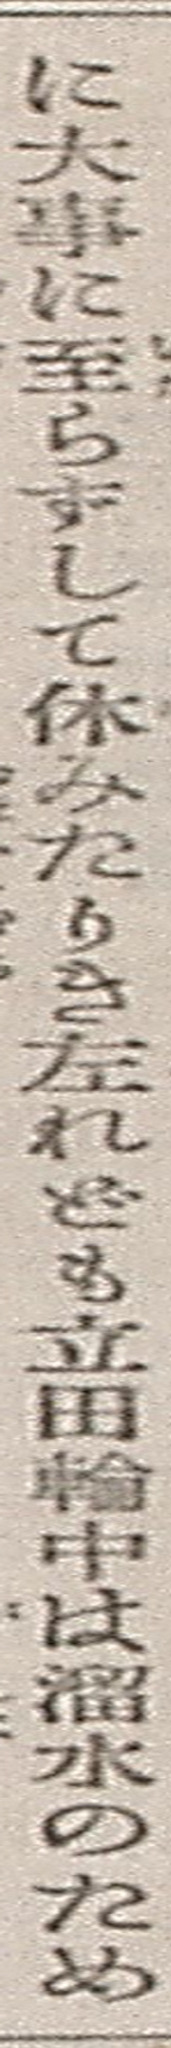に大事に至らずして休みたりき左れども立田輪中は溜水のため
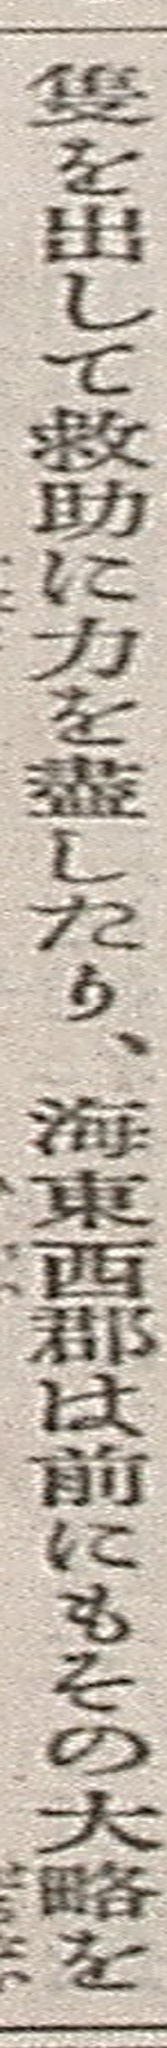隻を出して救助に力を盡したり、海東西部は前にもその大略を
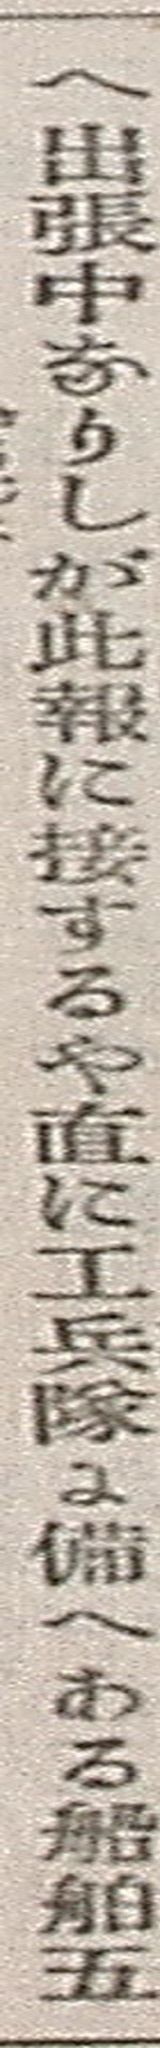へ出張中なりしが此報に接するや直に工兵隊に備へある船舶五
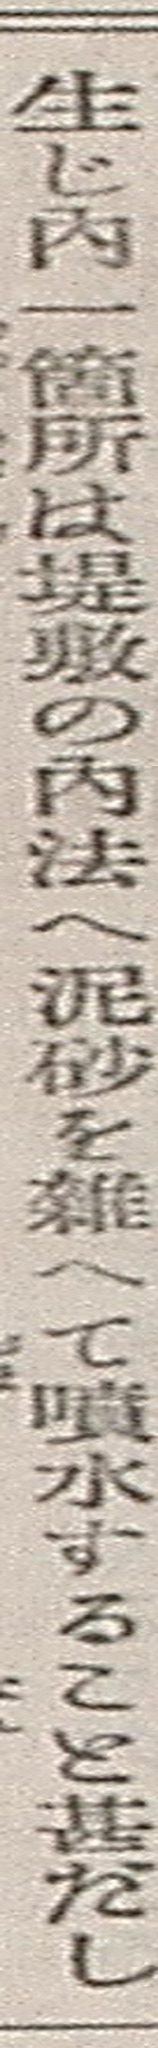生じ内一箇所は堤敷の内法へ泥砂を雑へて噴水すること甚だし
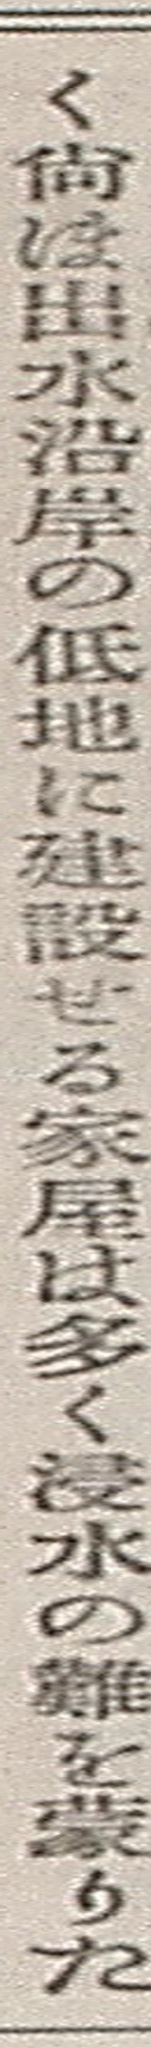く尚ほ出水沿岸の低地に建設せる家屋は多く浸水の難を蒙りた
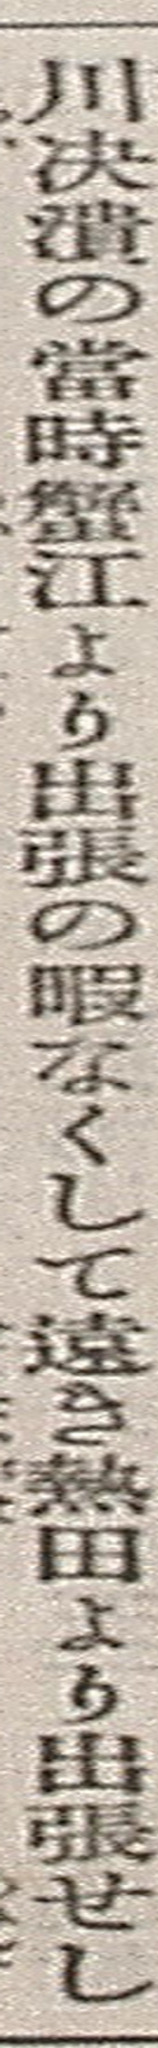川決潰の当時蟹江より出張の暇なくして遠き熱田より出張せし
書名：風俗畫報臨時増刊第百二十六號　洪水被害録（中）
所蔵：東京大学地震研究所図書室 Earthquake Research Institute Library, The University of Tokyo, JAPAN
